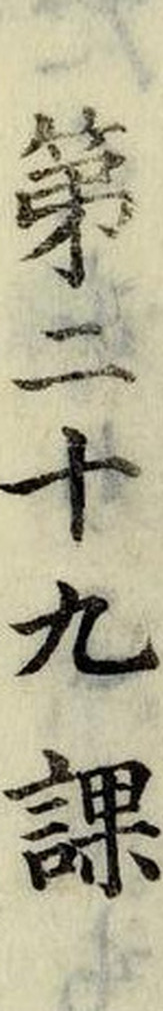第二十九課
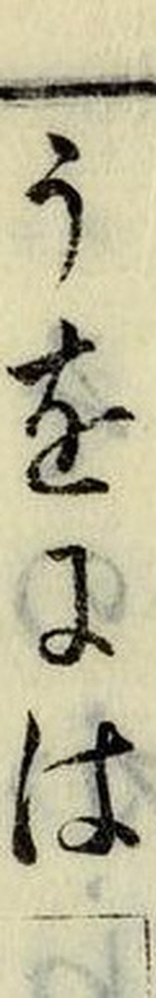うをには
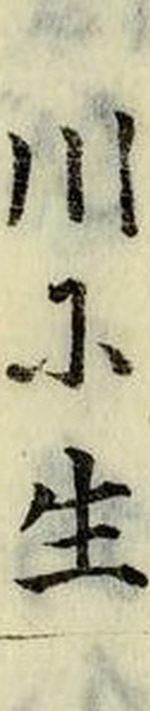川に生
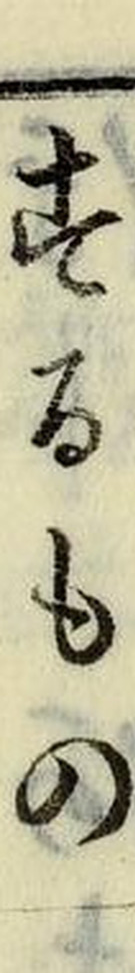ずるもの
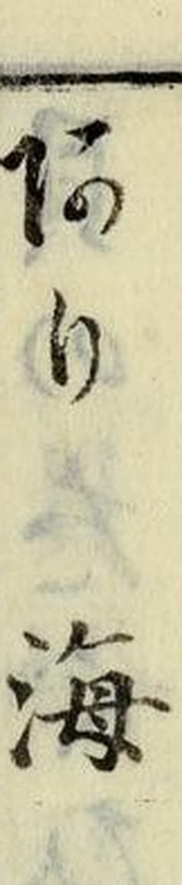あり海
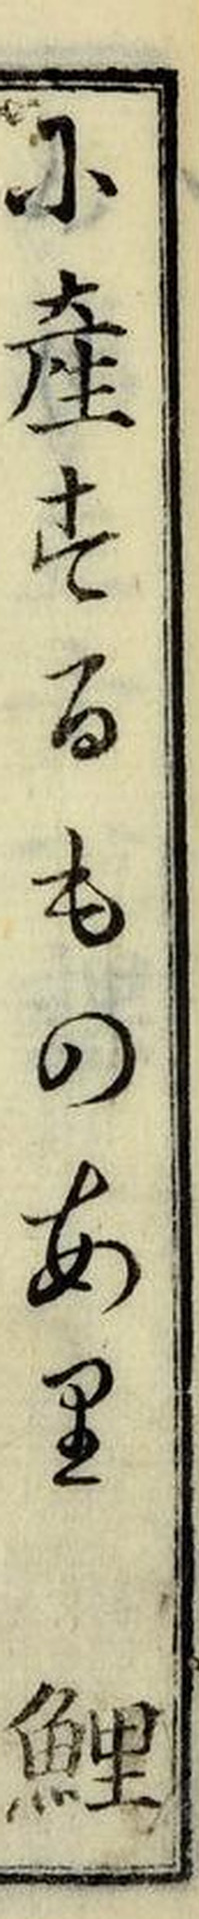に産するものあり鯉
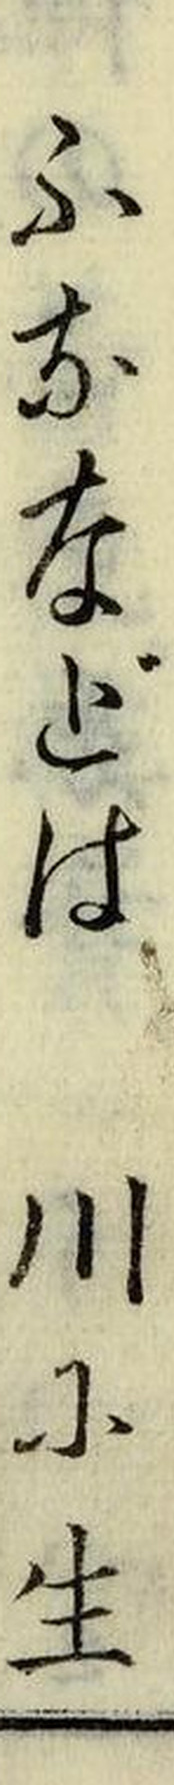ふななどは川に生
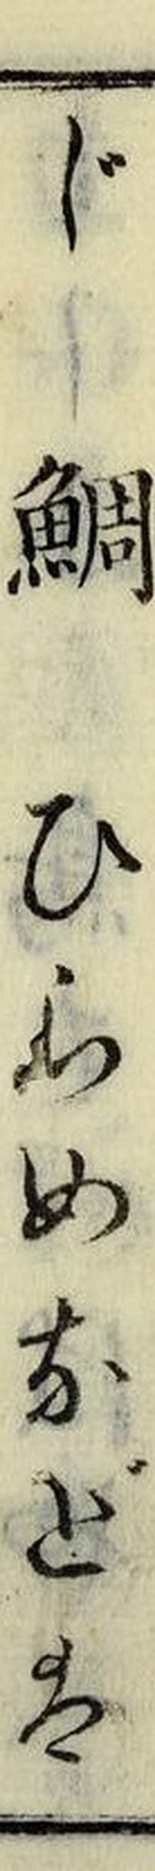じ鯛ひらめなどは
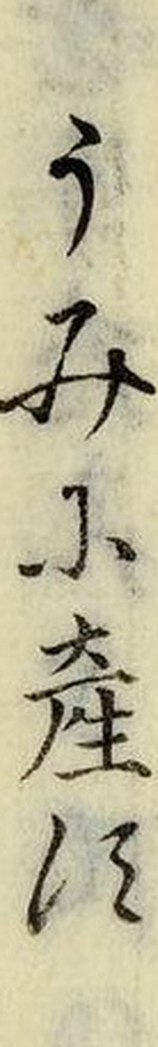うみに産す
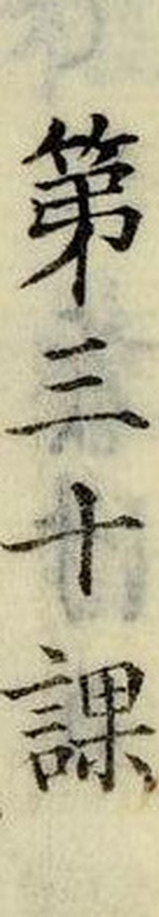第三十課

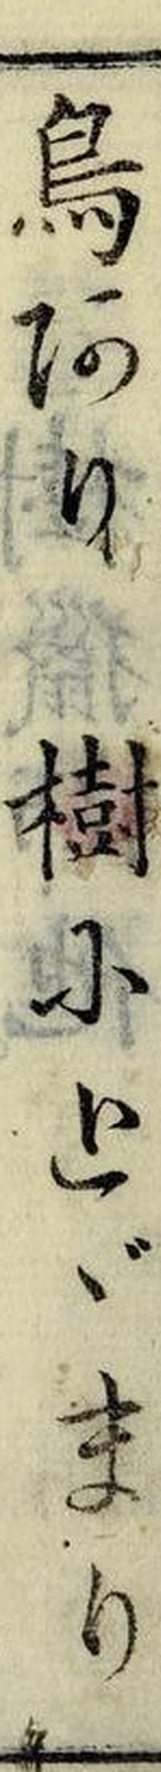鳥あり樹にとゞまり
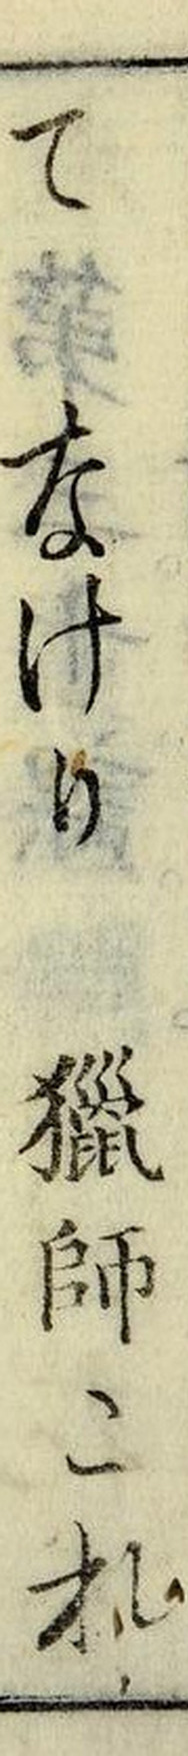てなけり猟師これ
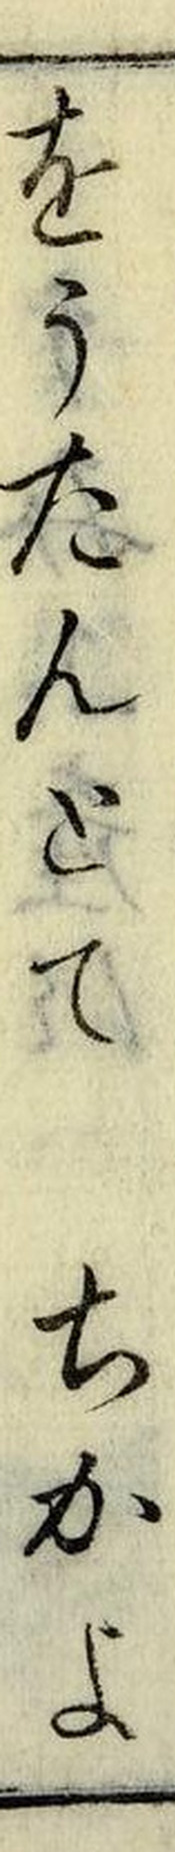をうたんとてちかよ
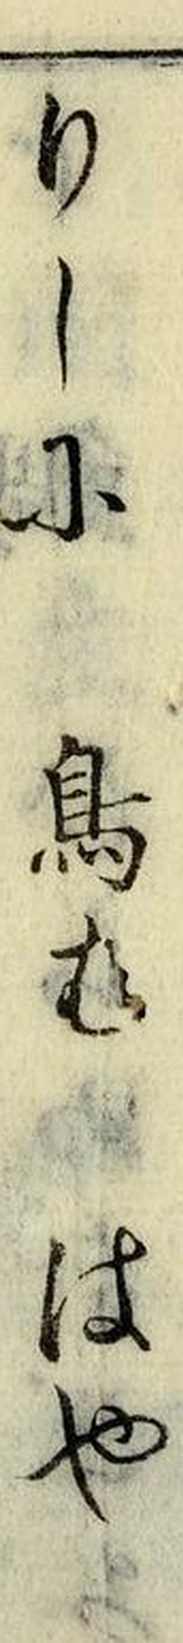りしに鳥ははや
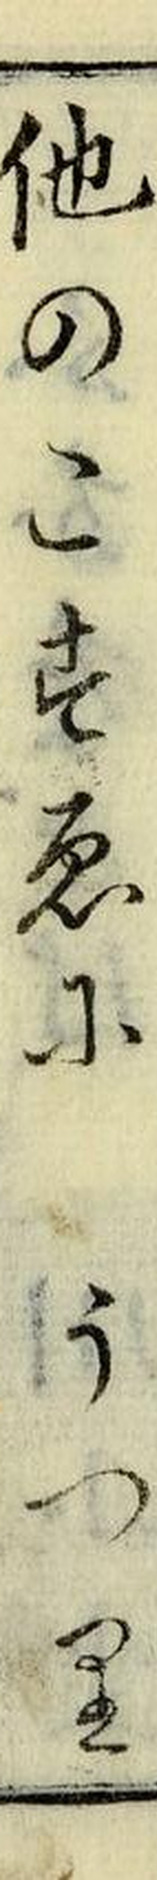他のこすゑにうつり
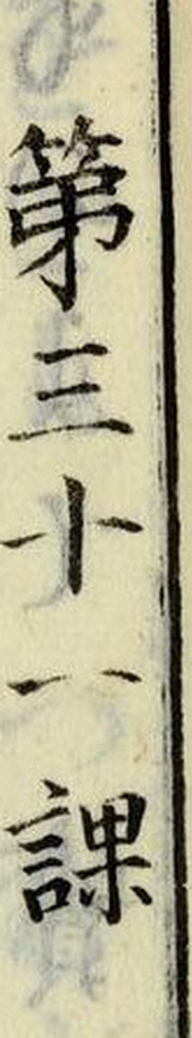第三十一課
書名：小学読本 初等科 巻一
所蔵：福井県文書館 Fukui Prefectural Archives
